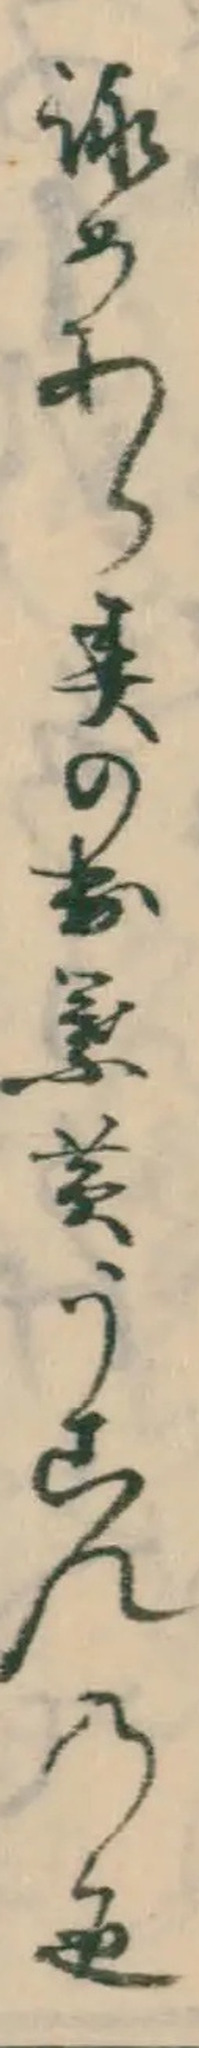詠めあり春の出葉黄うこんの色
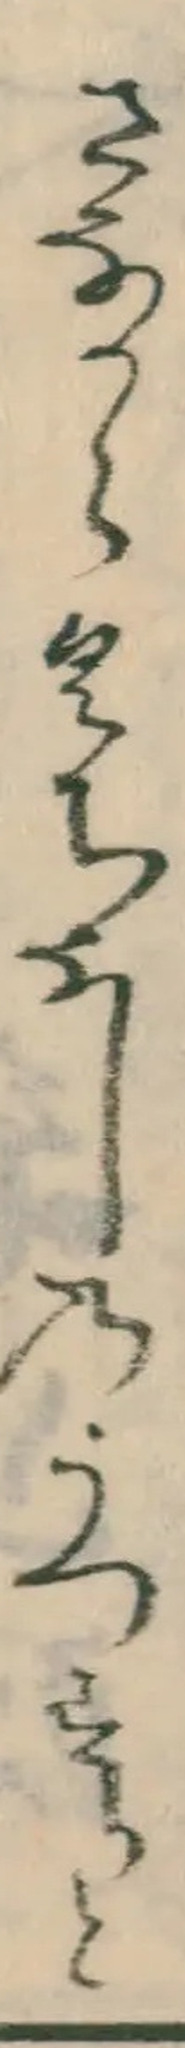さなからくちなしのうつすりと
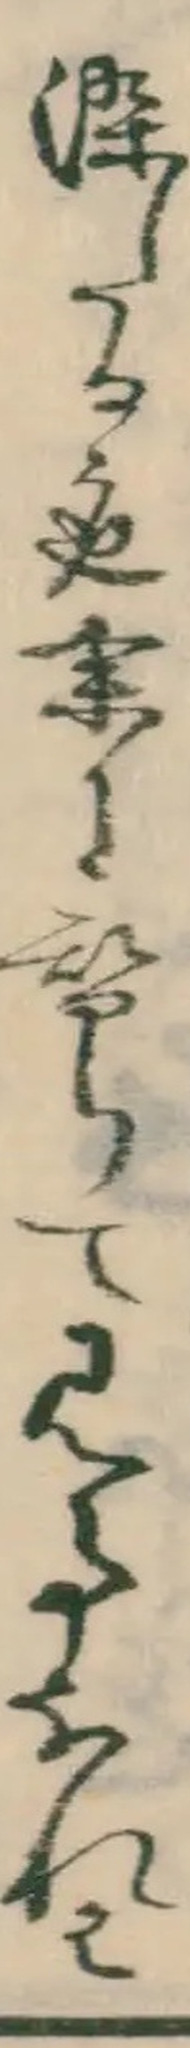染たる色余に替りて見事なれは
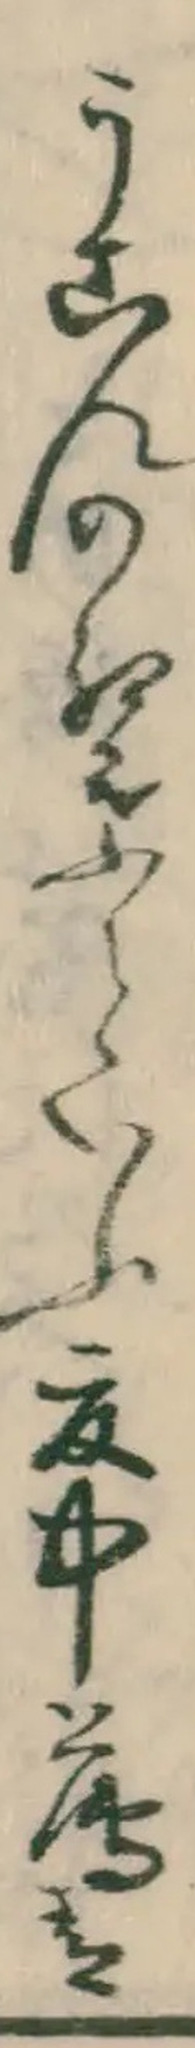うこんの紅葉といふ夏中薄青
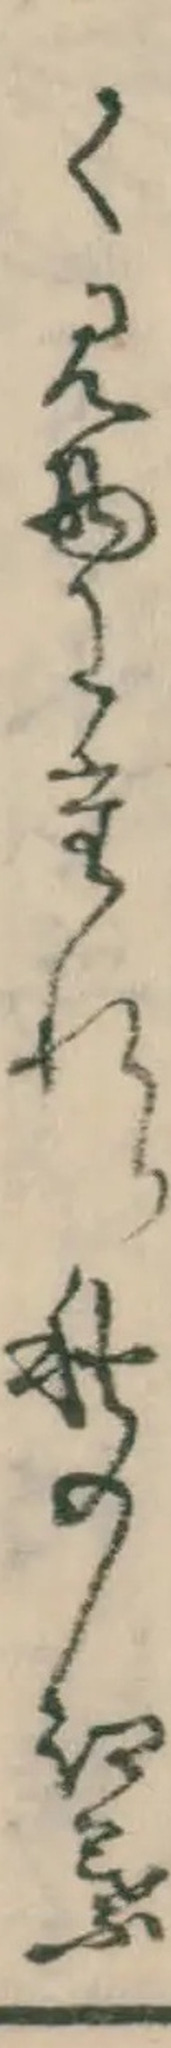く見物にたれり秋の紅葉
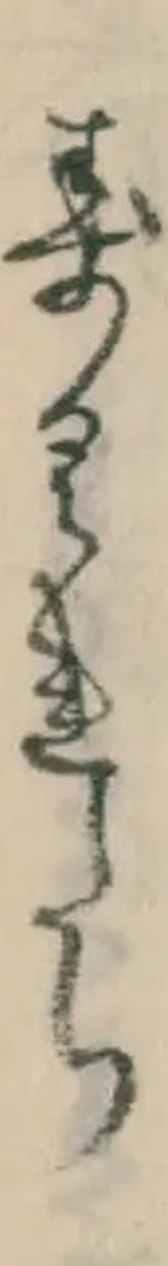すくれたり
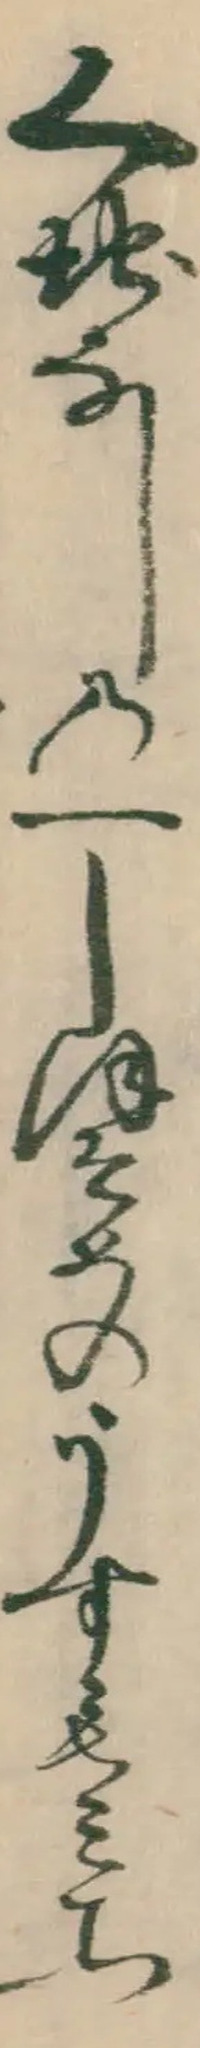くちなしの一しほそめのうすもみち
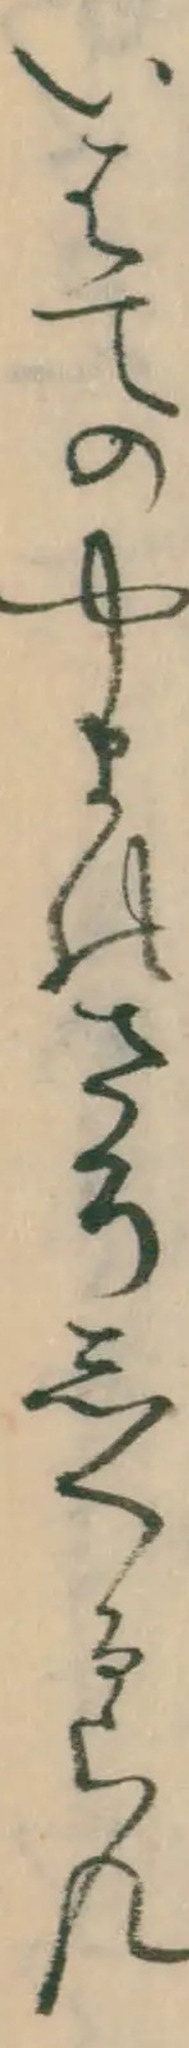いはてのやまのさそしくるらん

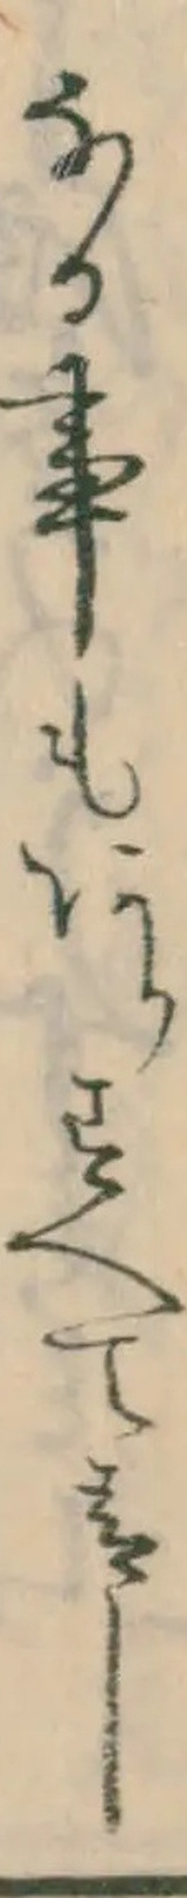なる事もありすへて青し
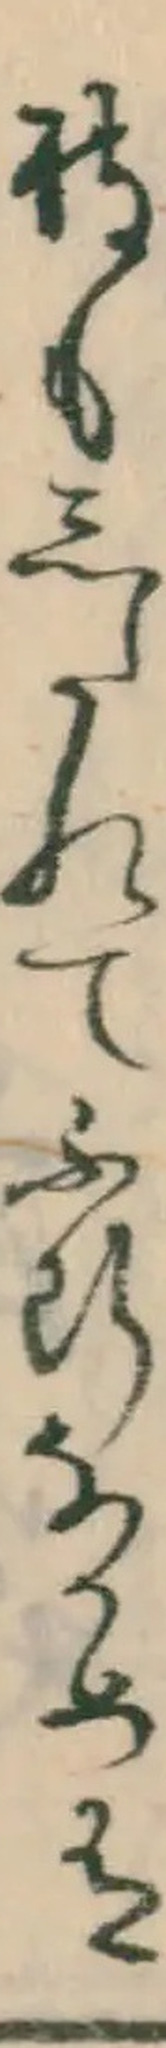枝もしたれて不断なかめ有
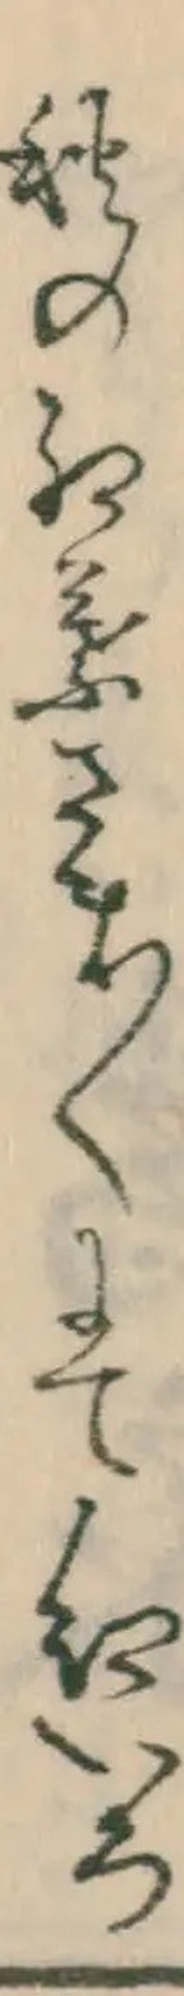秋の紅葉さま〳〵にて紅いろ
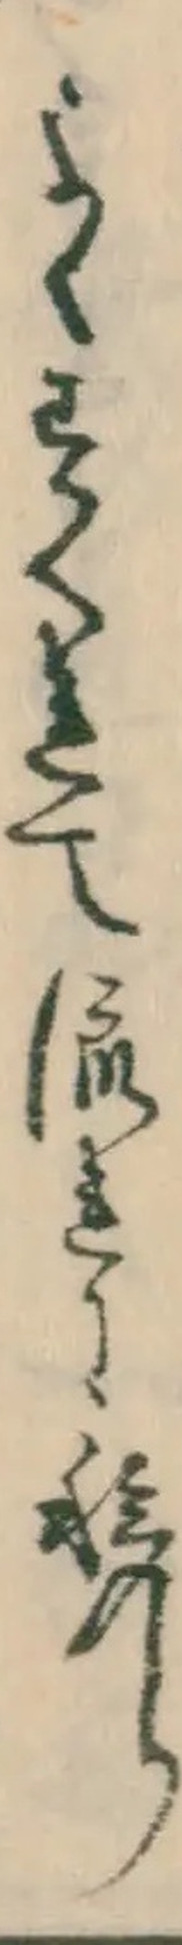よくすくれて流れに移り
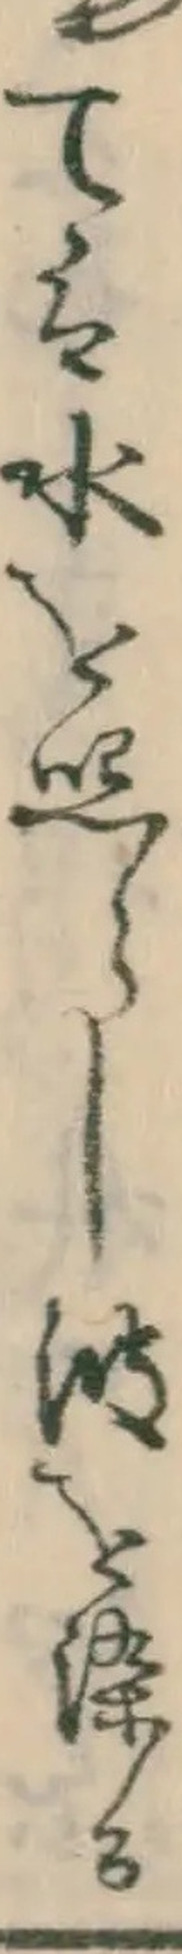ては水を照らし波を染る
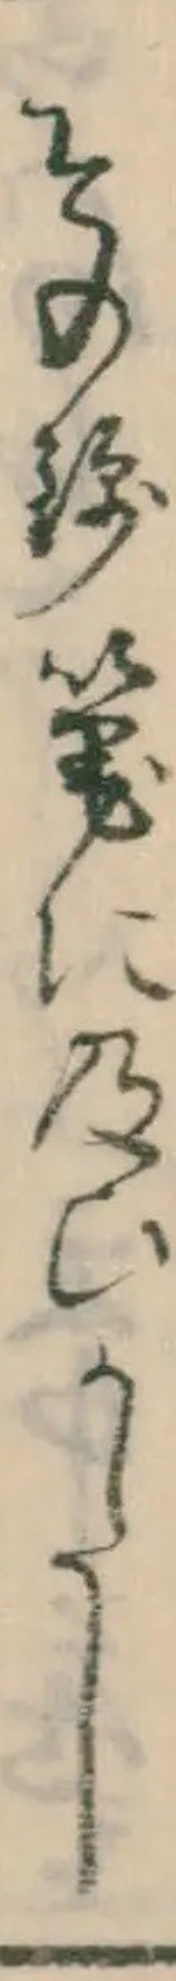その錦筆に及ひかたし
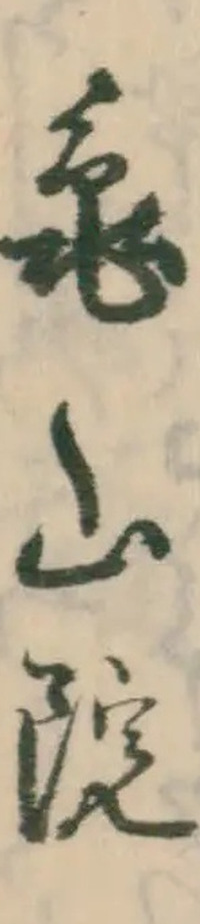亀山院
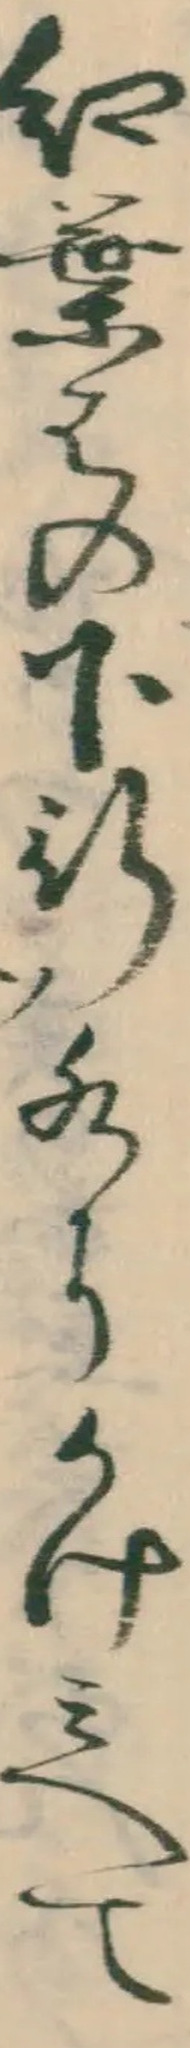紅葉はの下行水にかけみへて
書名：紅葉集
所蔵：国立国会図書館 National Diet Library, JAPAN
